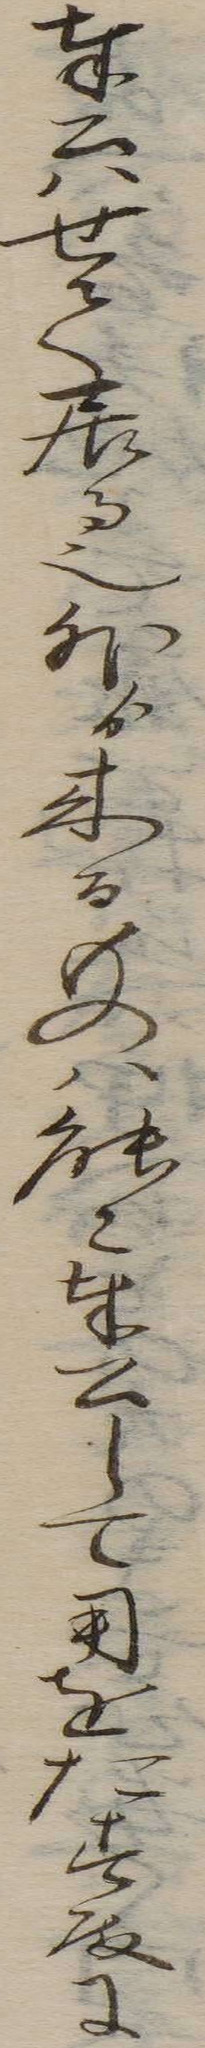奉公はせて居る也外ゟ来るものは能々奉公して用をたす殿に
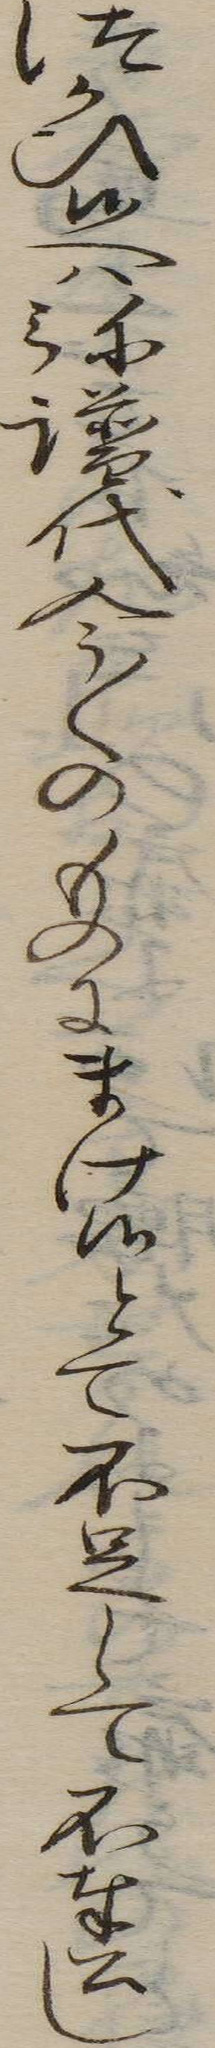つかひ候へは弥譜代今〳〵のものにまけ候とて不足して不奉公し
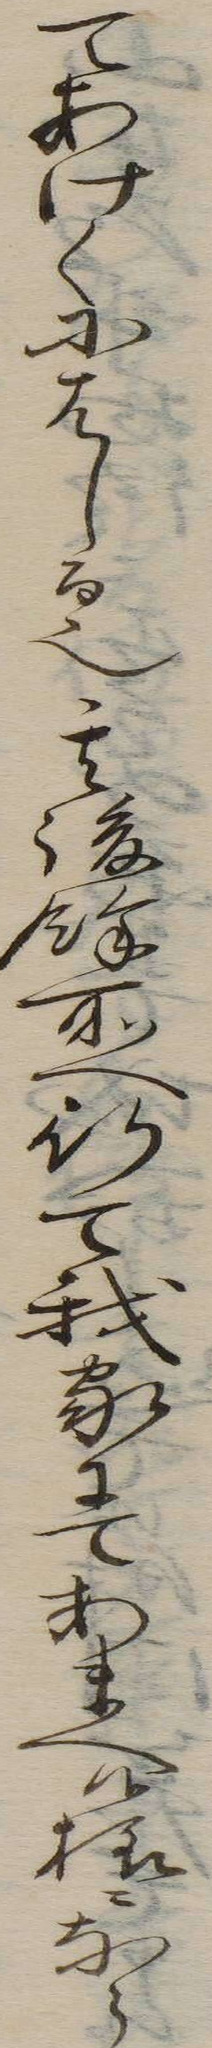てあけくにはしる也其後余処へ行て我家にてあまへ候様ニなら
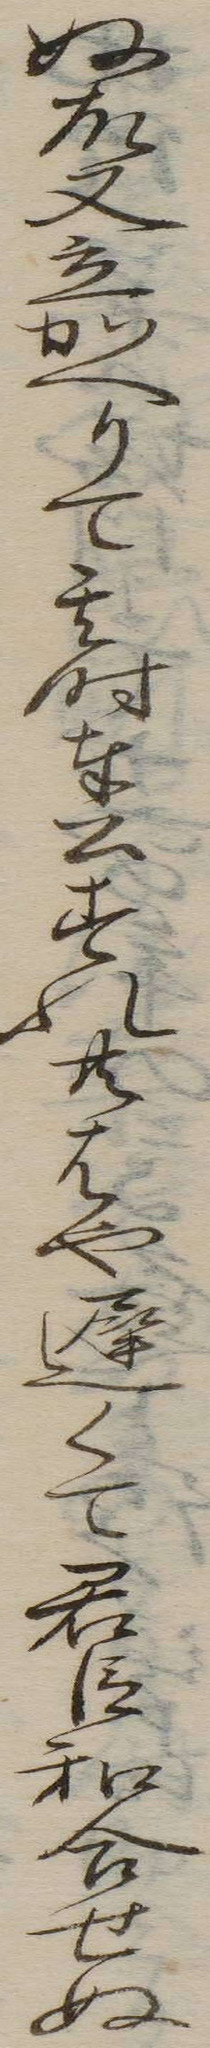ぬ故又立かへりて其時奉公すれ共はや遅くて君臣和合せぬ
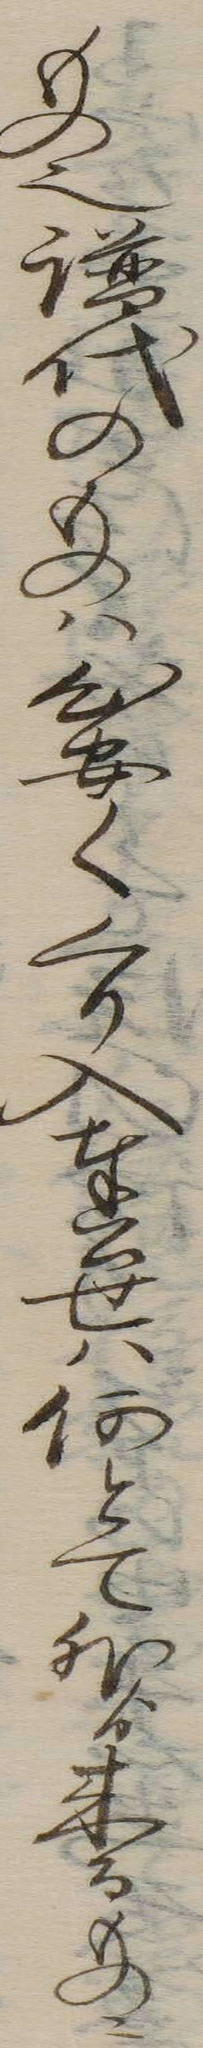もの也譜代のものは心安くくり入奉公せは何とて外ゟ来るものニ
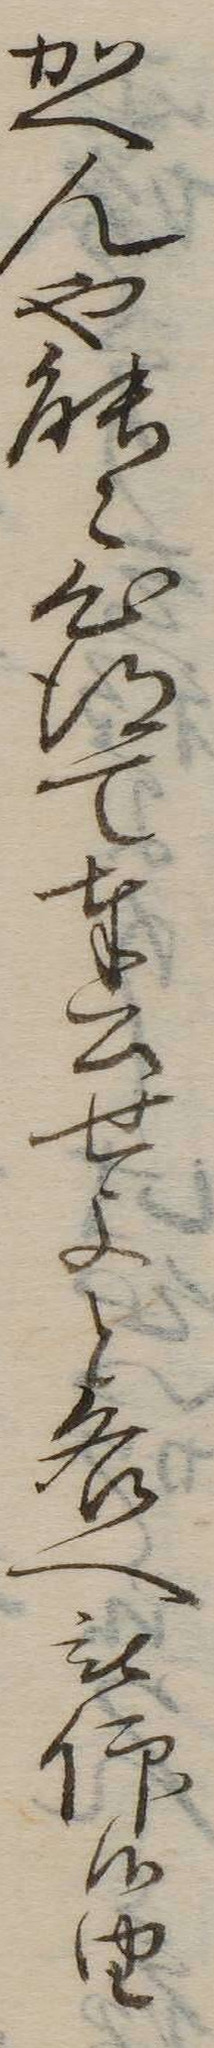かへんや能々心得て奉公せよと各へ被仰候由
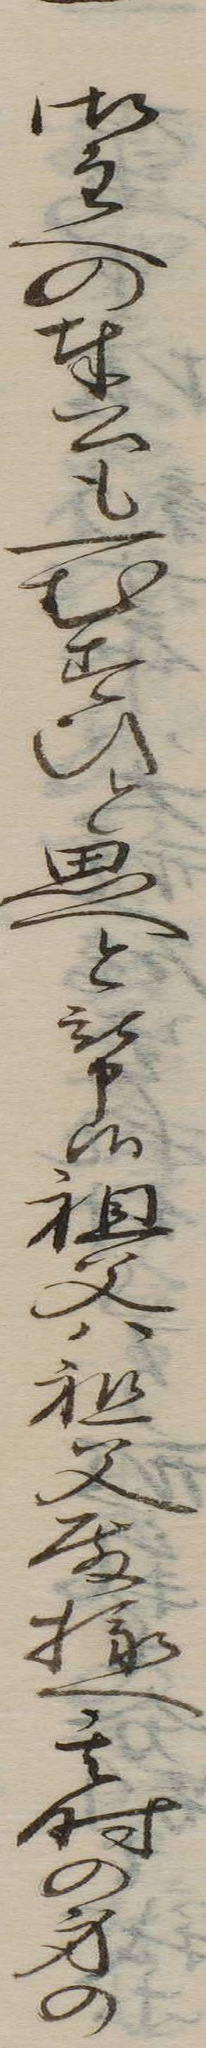一御主人の奉公も一むすひと思へと被申候祖父は祖父殿様へ其時の身の
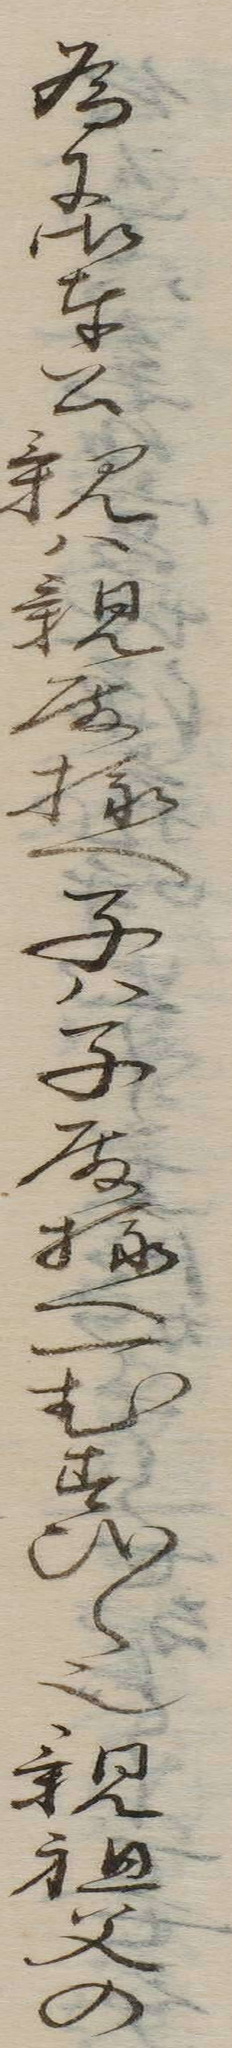為に御奉公親は親殿様へ子は子殿様へ一むすひ〳〵也親祖父の
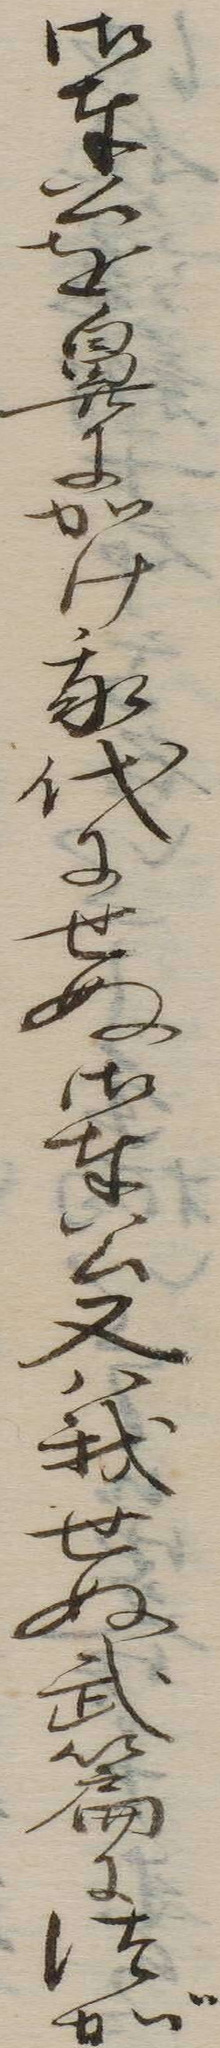御奉公を鼻にかけ我代にせぬ御奉公又は我せぬ武篇につが
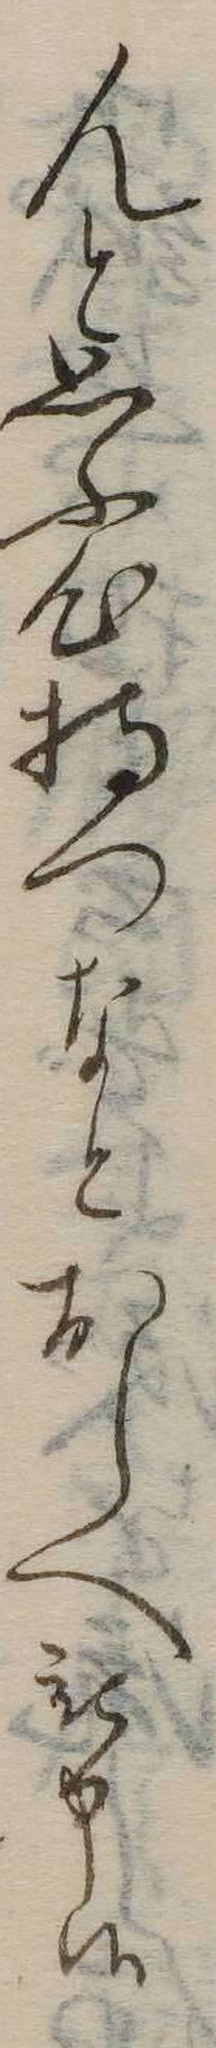んと思ふ心持つなとおしへ被申候
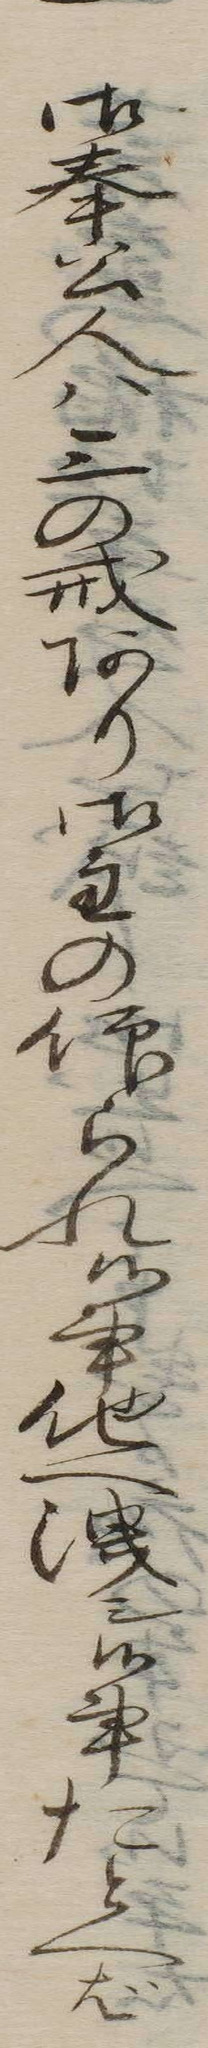一御奉公人は三の戒あり御主の仰られ候事他へ洩シ候事たとへば
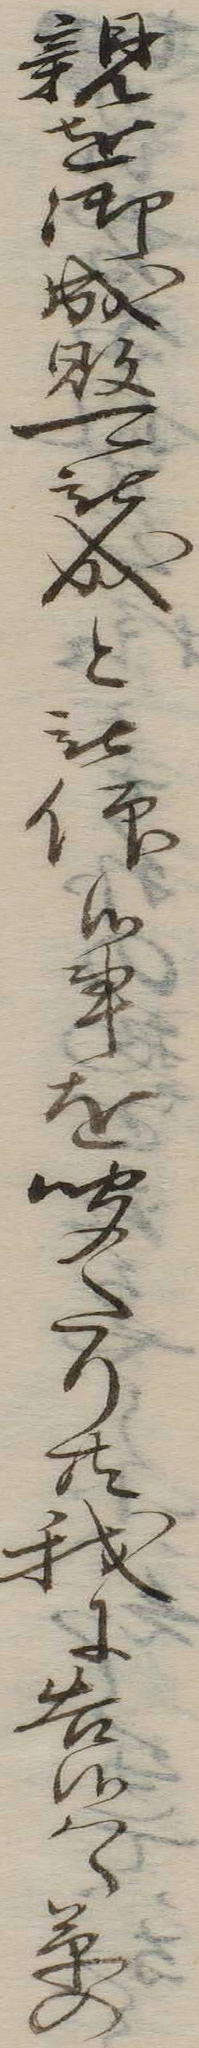親を御成敗可被成と被仰候事を聞たり共我に告候はゝ草の
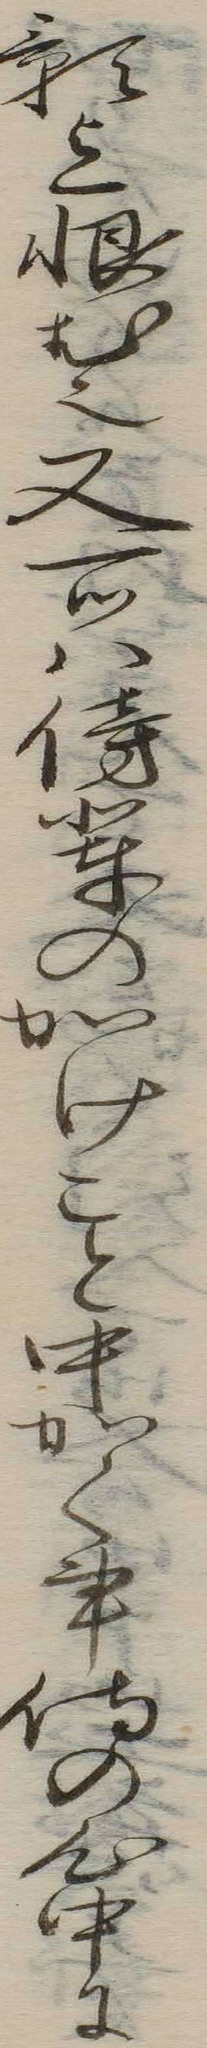影迄恨む也又一ツは侍輩のかけこと中かく事侍の心中に
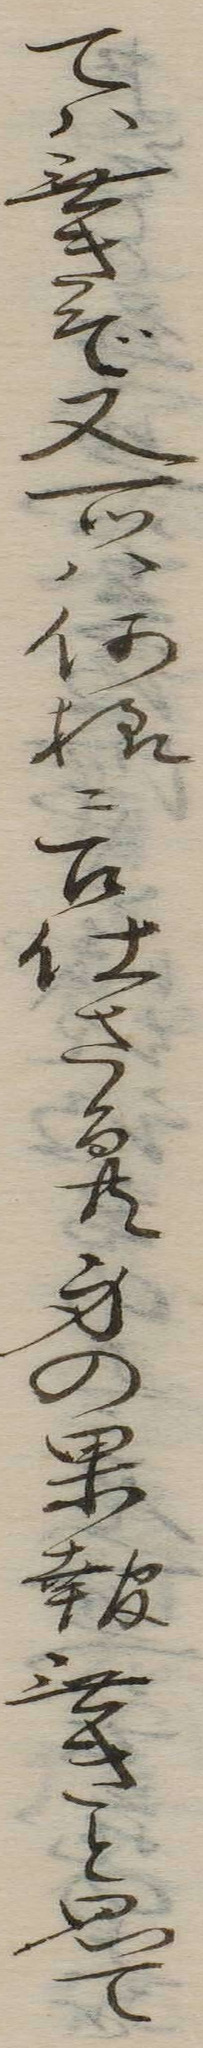ては無きぞ又一ツは何様ニ召仕さる共身の果報無きと思て
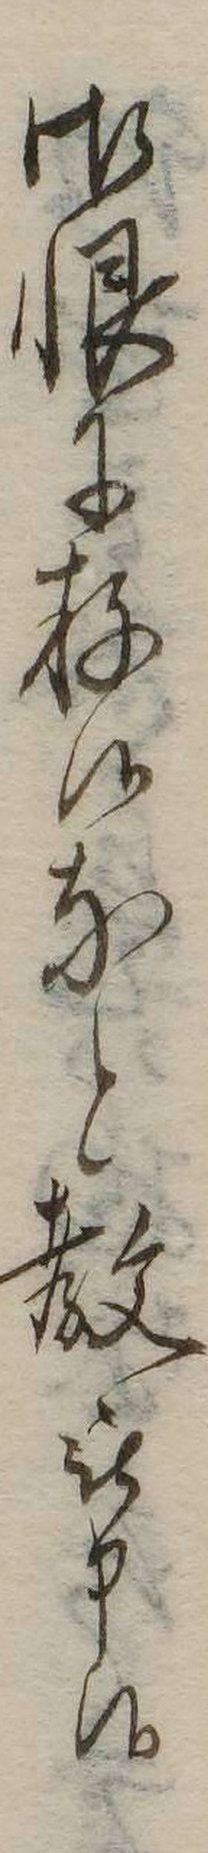御恨に存候なと教被申候
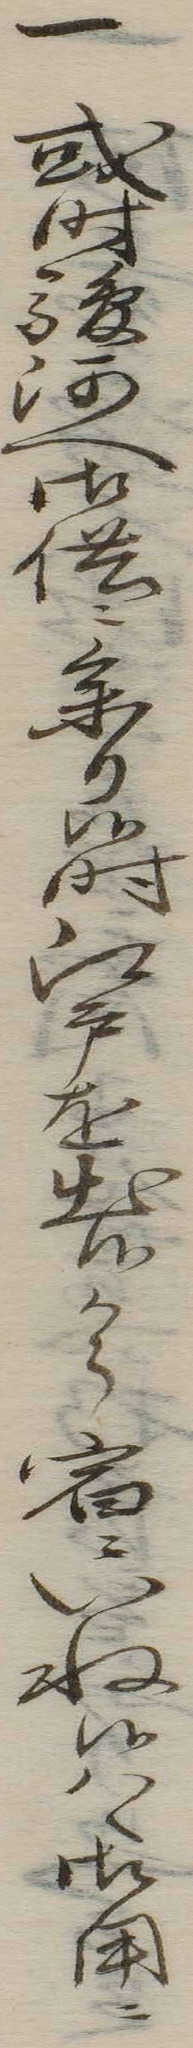一或時駿河へ御供ニ参候時江戸を出候から宿ニいね候はゝ御用ニ
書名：三河之物語
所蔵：国文学研究資料館
